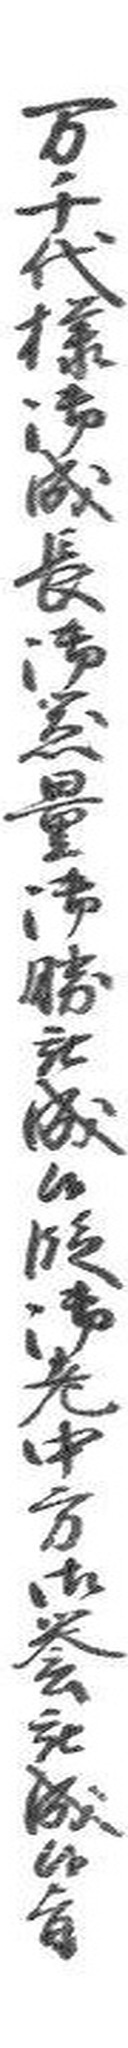万千代様御成長御器量御勝被成候段御老中方御誉被成候旨
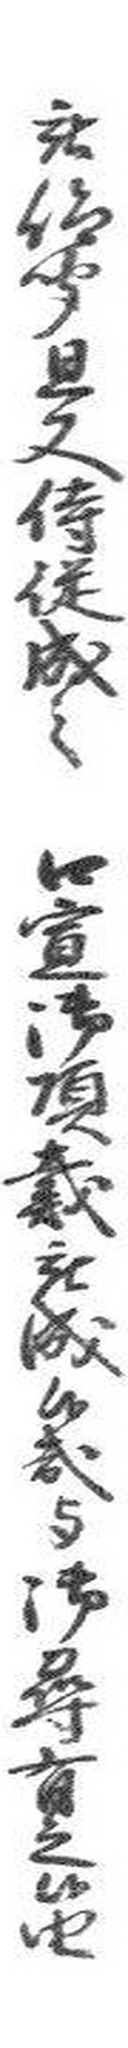被仰聞且又侍従成之口宣御頂戴被成候哉与御尋有之候由
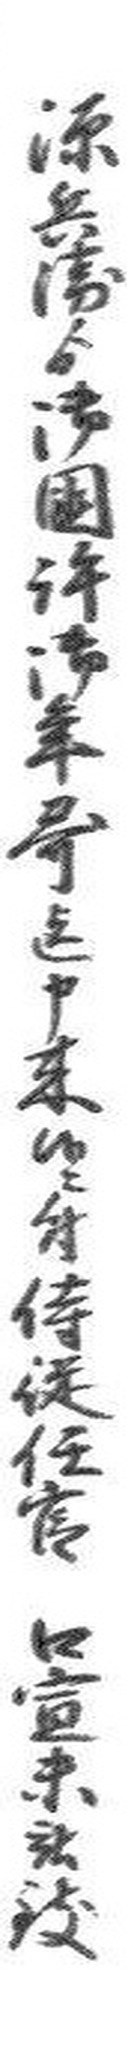源兵衛ゟ御国許御年寄迄申来候ニ付侍従任官口宣未被致
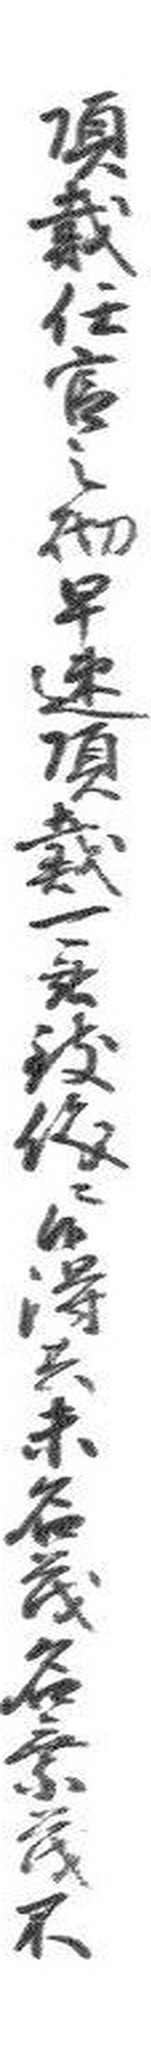頂戴任官之砌早速頂戴可被致儀ニ候得共未名茂名乗茂不
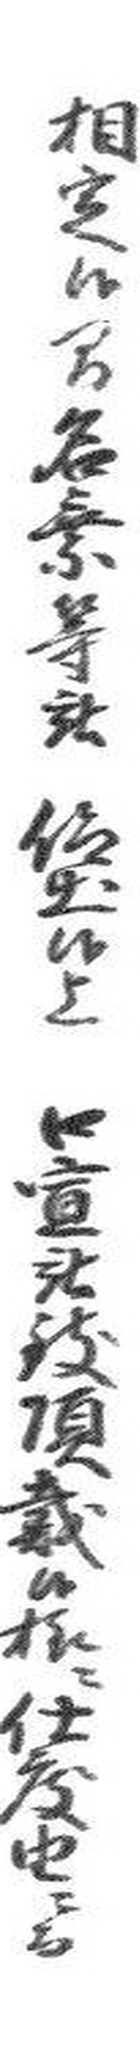相定候間名乗等被仰出候上口宣被致頂戴候様ニ仕度由ニ而
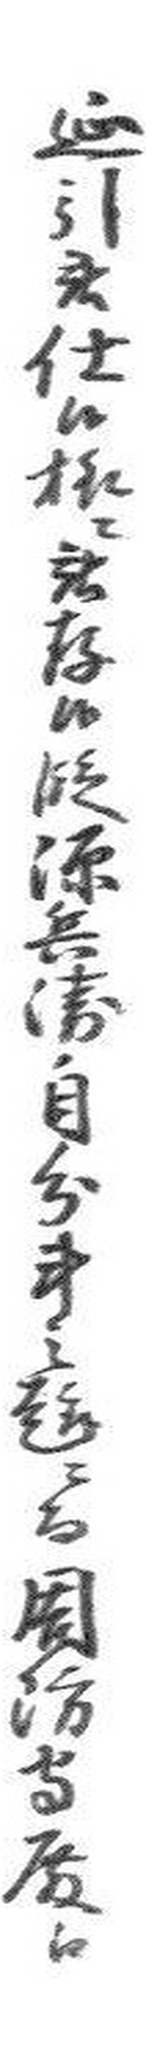延引被仕候様ニ被存候段源兵衛自分斗之趣ニ而周防守殿江
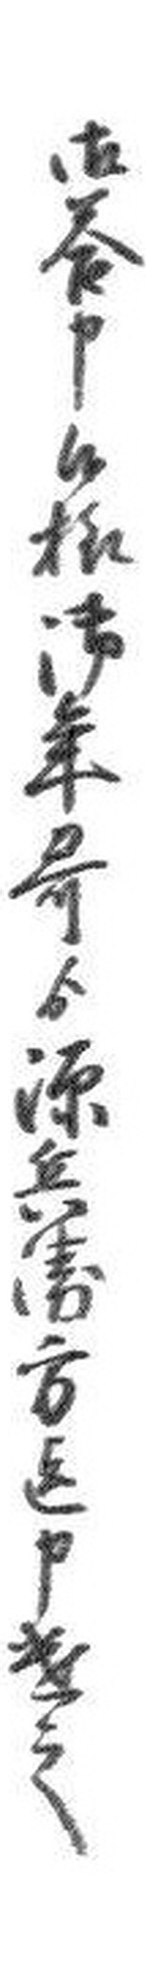御答申候様御年寄ゟ源兵衛方迄申遣之
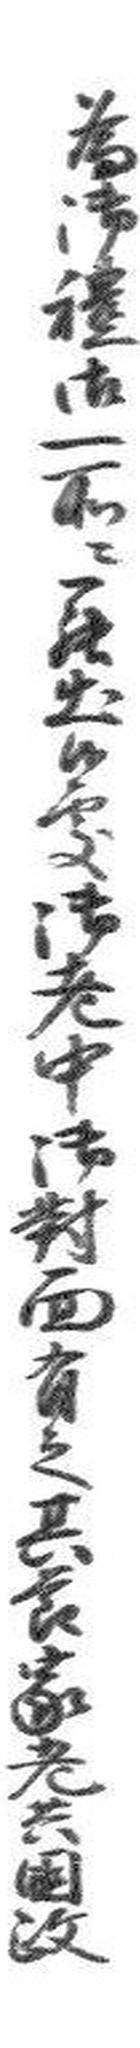為御礼御一所ニ罷出候処御老中御対面有之其節家老共国政
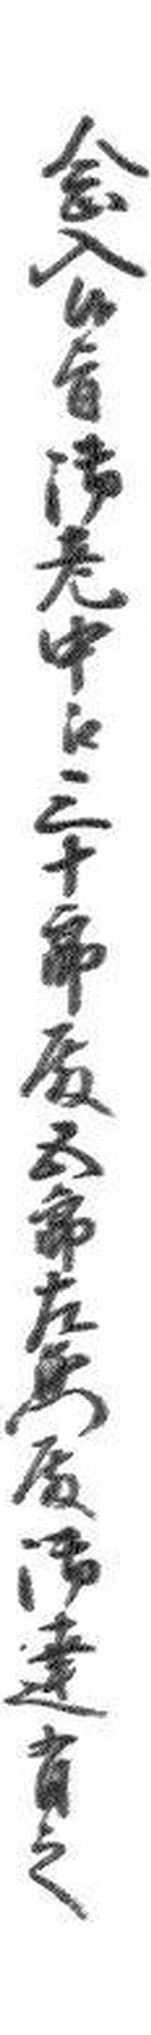念入候旨御老中江三十郎殿五郎左衛門殿御達有之
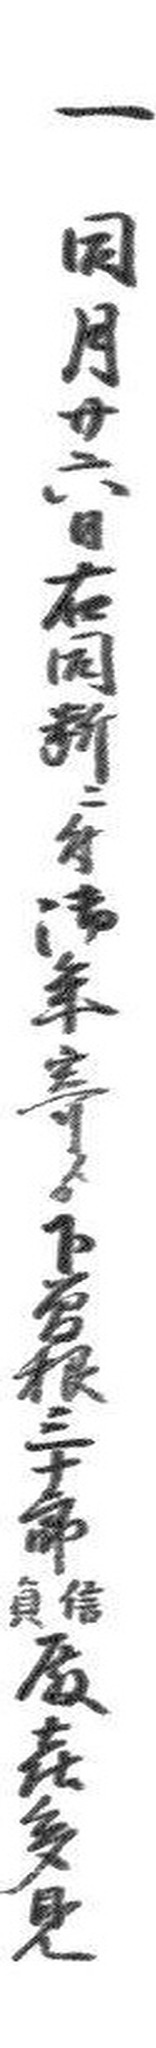一同月廿六日右同断ニ付御年寄ゟ下曾根三十郎信貞殿喜多見

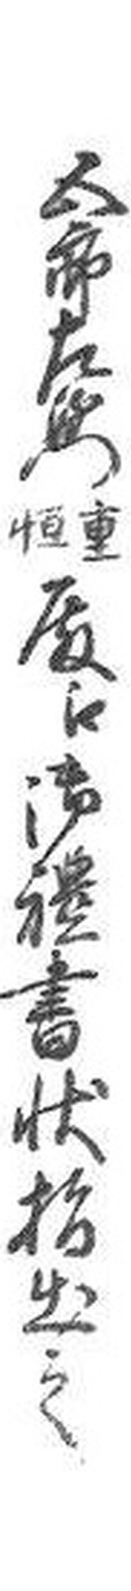五郎左衛門重恒殿江御礼書状指出之
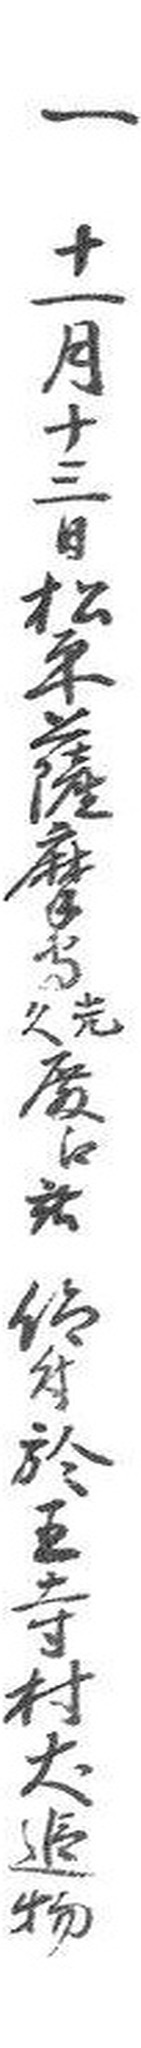一十一月十三日松平薩摩守光久殿江被仰付於王寺村犬追物
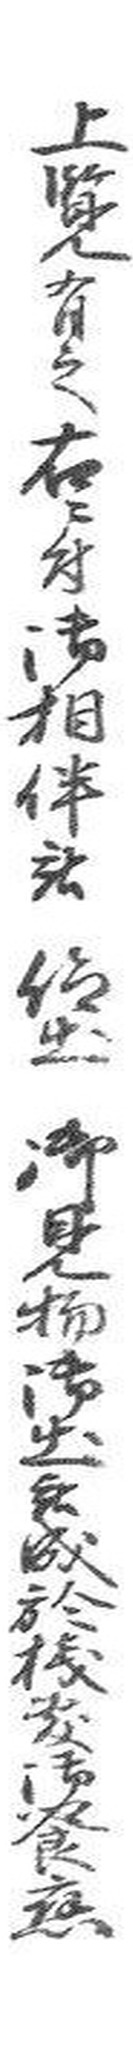上覧有之右ニ付御相伴被仰出御見物御出被成於桟敷御饗応
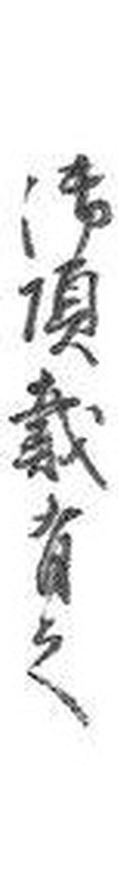御頂戴有之
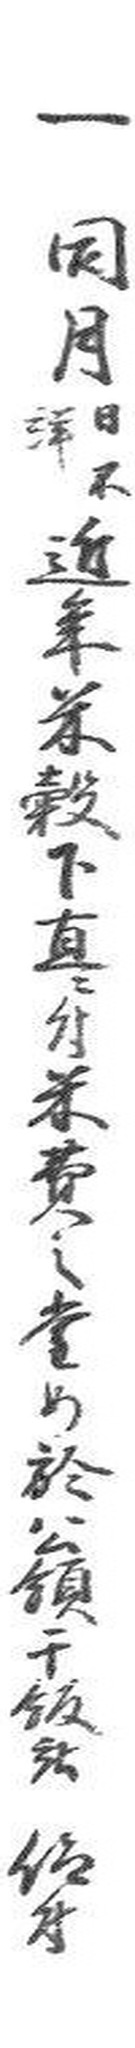一同月日不詳近年米穀下直ニ付米費之ため於公領干飯被仰付
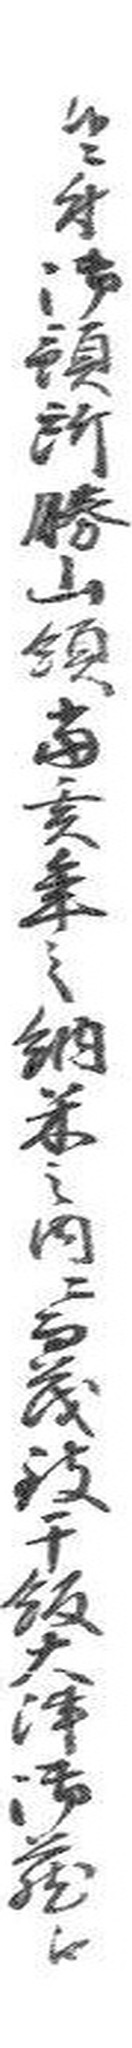候ニ付御預所勝山領当亥年之納米之内ニ而茂致干飯大津御蔵江
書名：家譜 五 光通公 従寛永十三年到万治二年
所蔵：福井県文書館 Fukui Prefectural Archives
